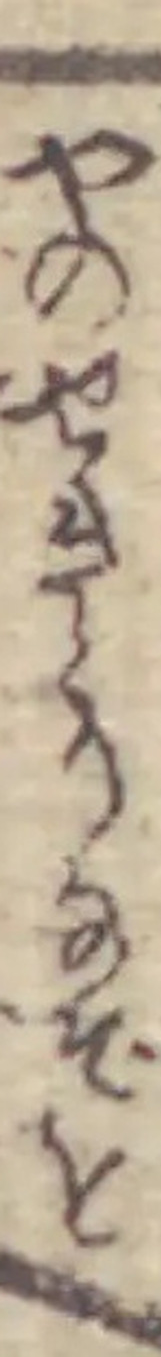やのせきとりなぞを
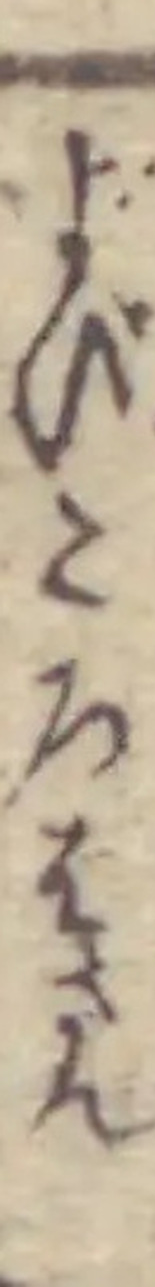よびころさん
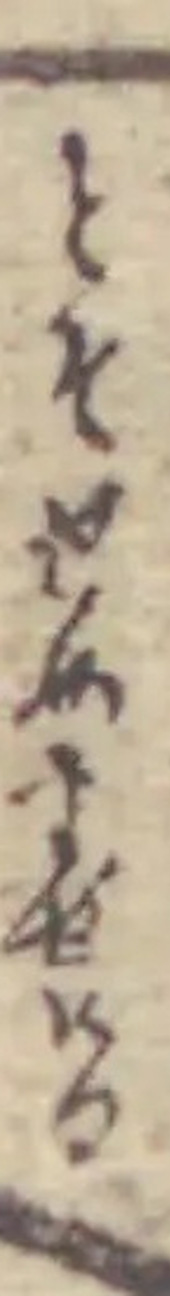とそせめにける
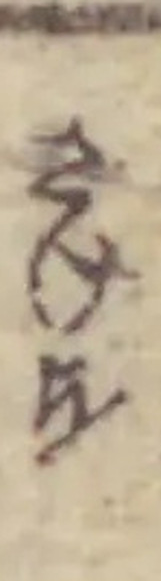さけを
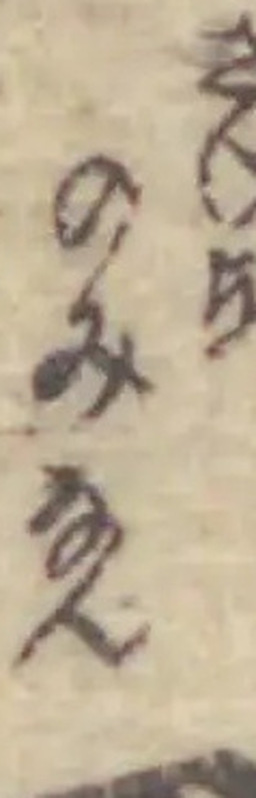のみなん
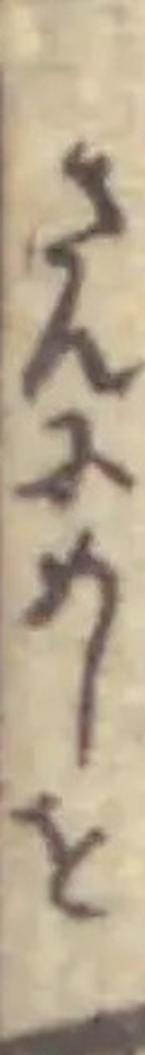さんにめしを
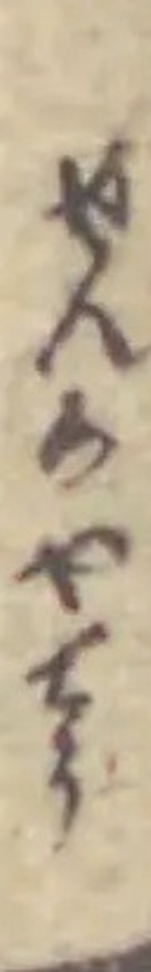せんかやて
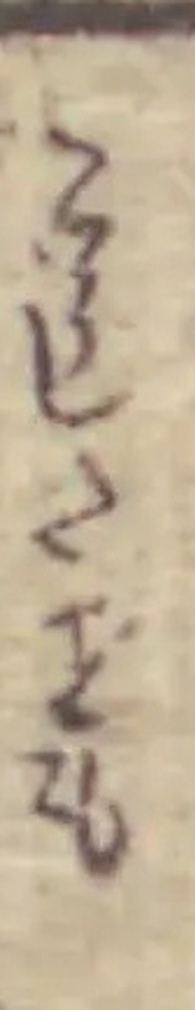こうしたことも
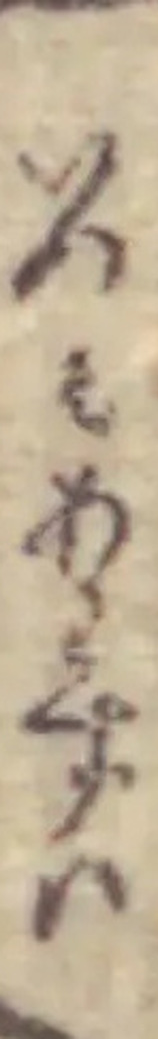いつもあわずは
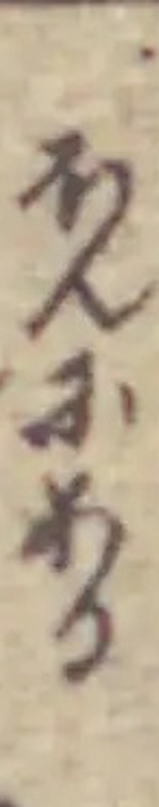ほんにある
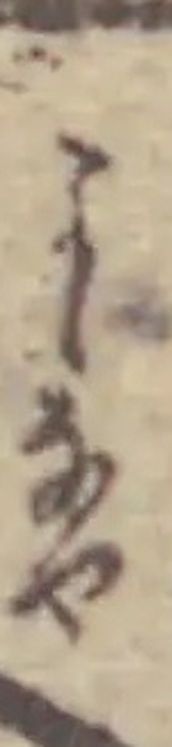よしなや

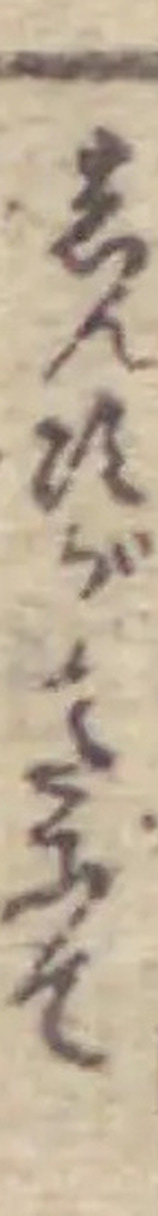しん次がかたにて
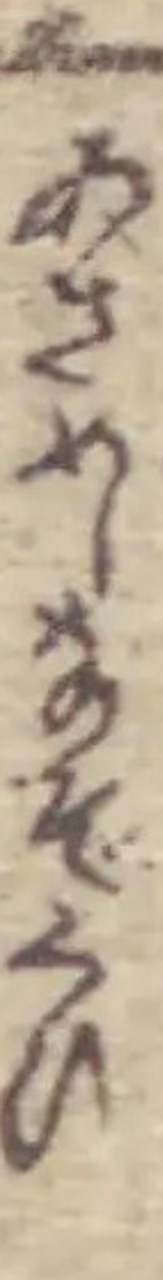あさめしなぞくひ
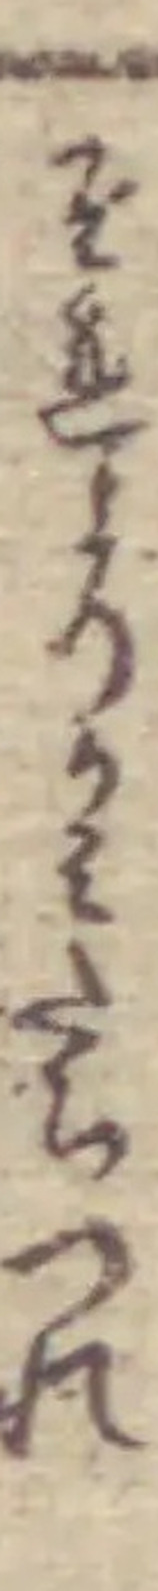それよりかみたちつれ
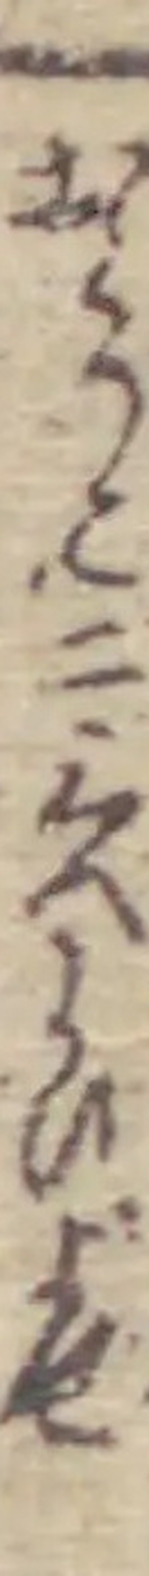おうと二三人よひよせ
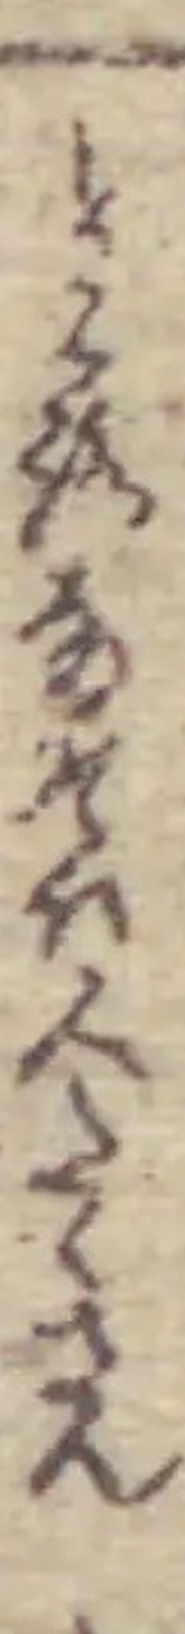ところなそは人たくさん
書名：夜野中狐物 2巻
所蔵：国立国会図書館 National Diet Library, JAPAN
